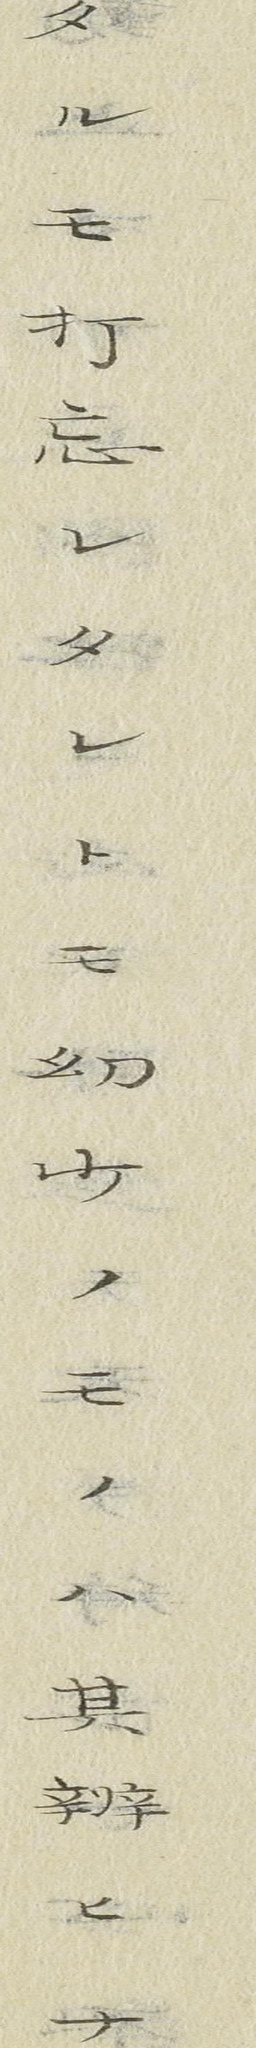タルモ打忘レタレトモ幼少ノモノハ其弁ヒナ
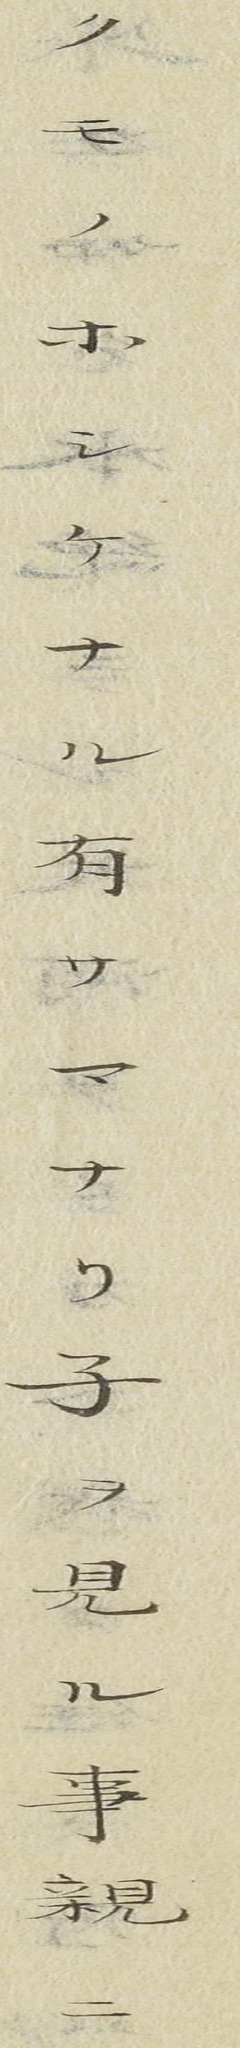クモノホシケナル有サマナリ子ヲ見ル事親ニ
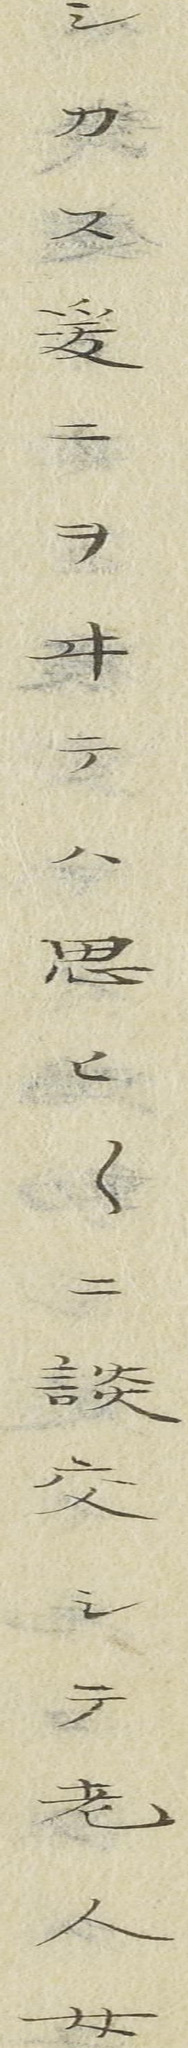シカス爰ニヲヰテハ思ヒ〱ニ談交シテ老人女
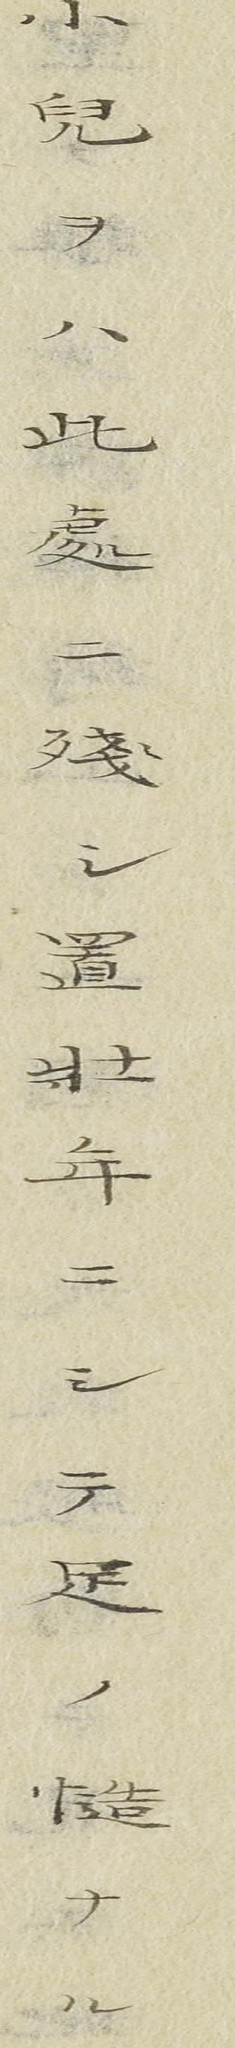小児ヲハ此処ニ残シ置壮年ニシテ足ノ慥ナル
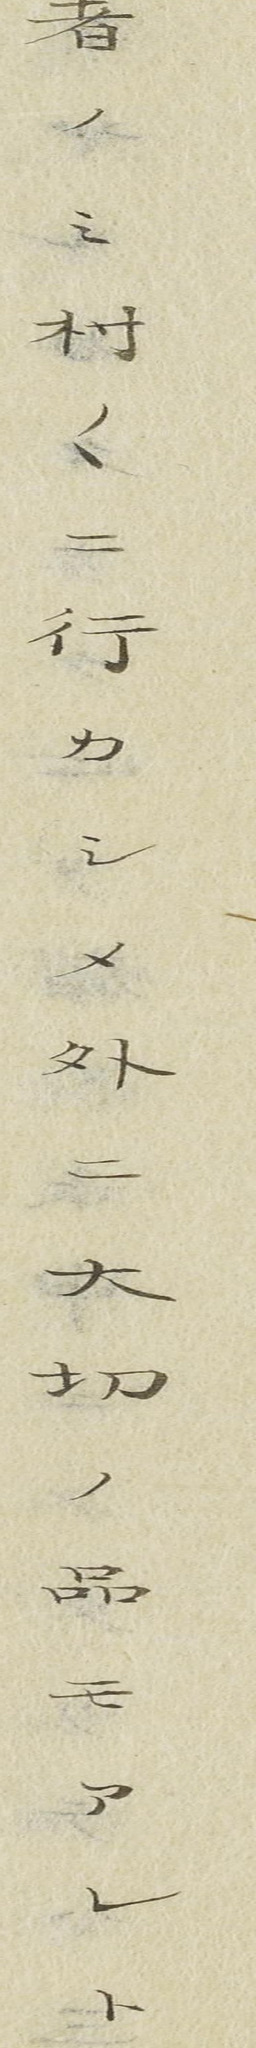者ノミ村〱ニ行カシメ外ニ大切ノ品モアレト
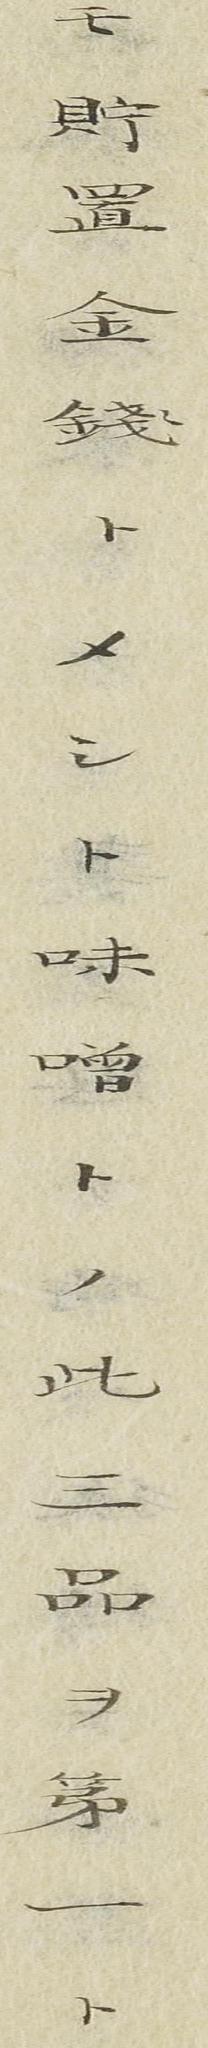モ貯置金銭トメシト味噌トノ此三品ヲ第一ト
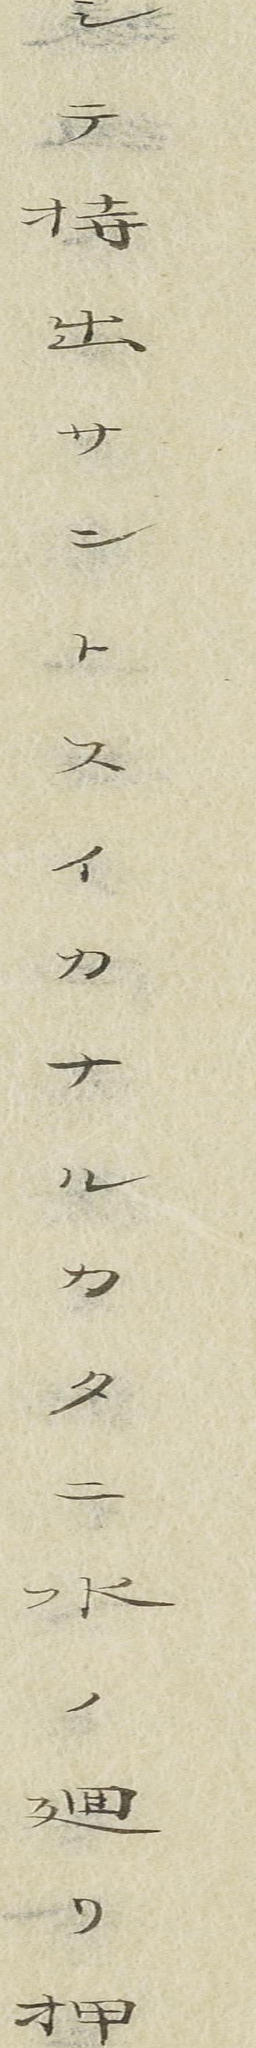シテ持出サントスイカナルカタニ水ノ廻リ押
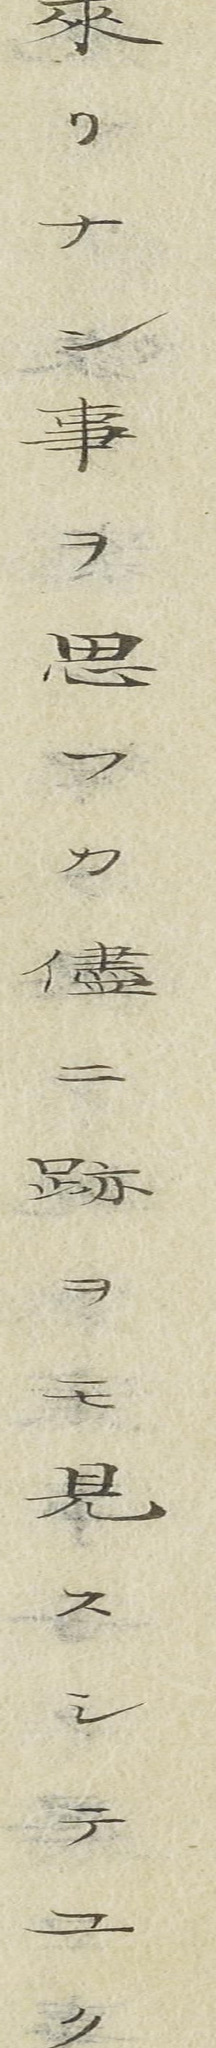来リナン事ヲ思フカ僅ニ跡ヲモ見スシテユク
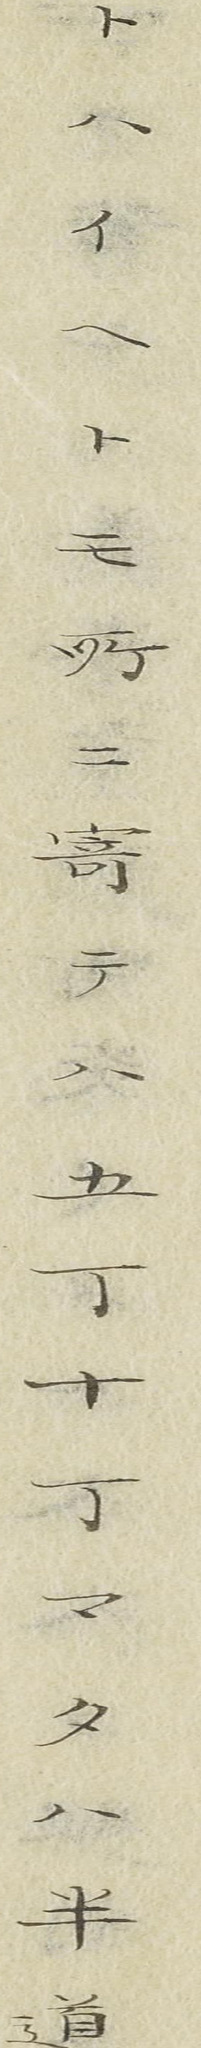トハイヘトモ所ニ寄テハ五丁十丁マタハ半道
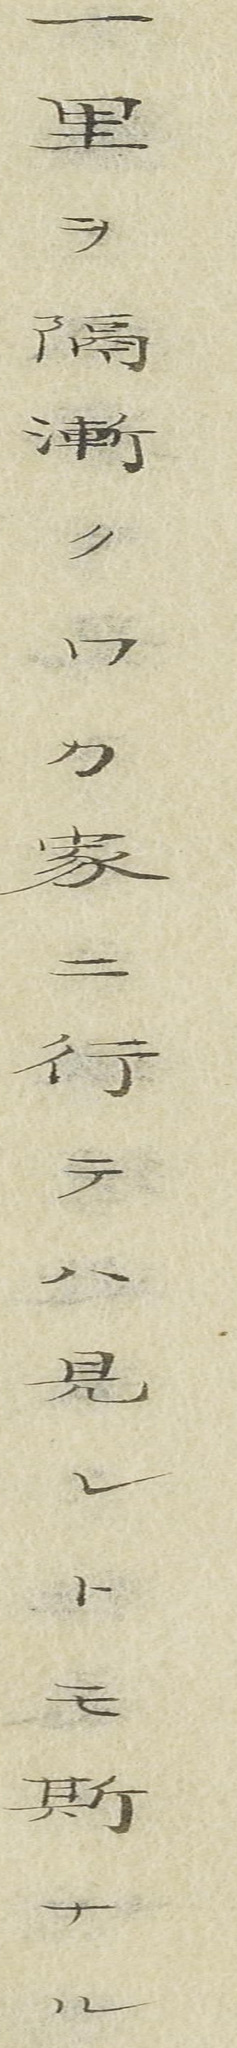一里ヲ隔漸クワカ家ニ行テハ見レトモ斯ナル
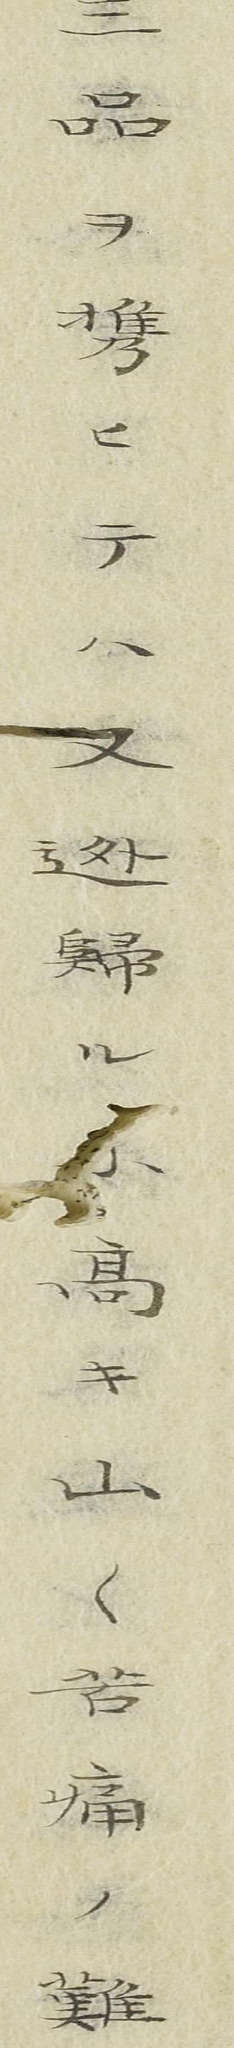三品ヲ携ヒテハ又逃帰ル小高キ山〱苦痛ノ難

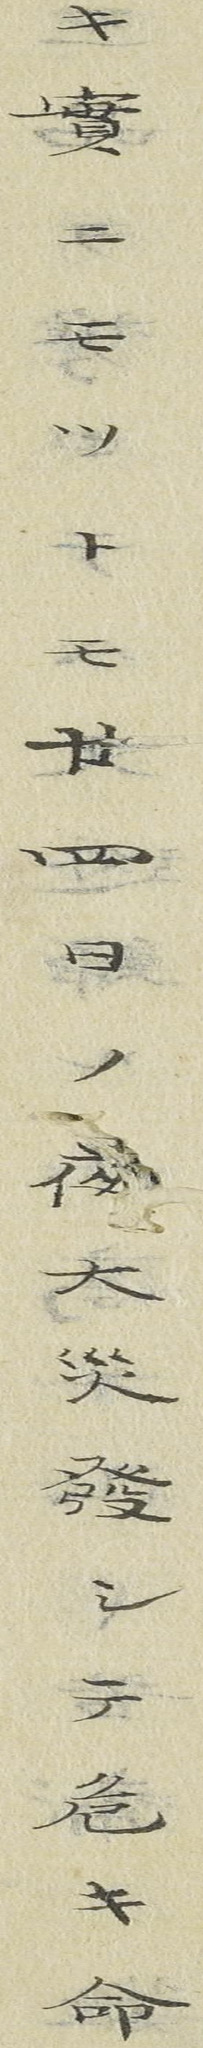キ実ニモツトモ廿四日ノ夜大災発シテ危キ命
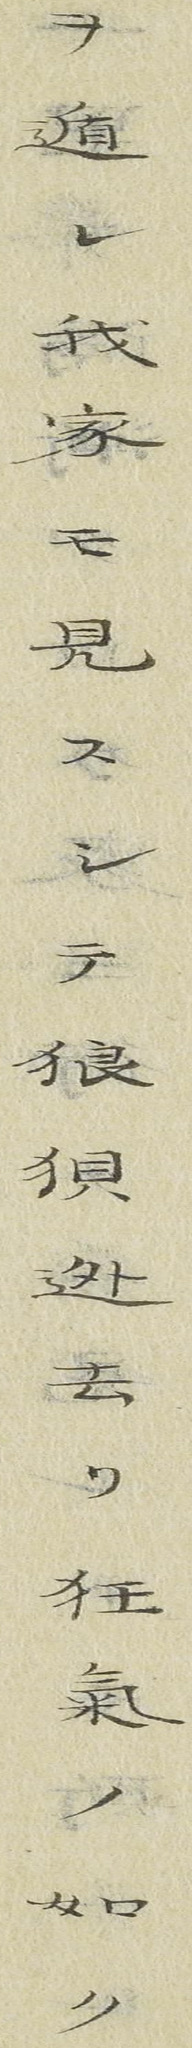ヲ遁レ我家モ見スシテ狼狽逃去リ狂気ノ如ク
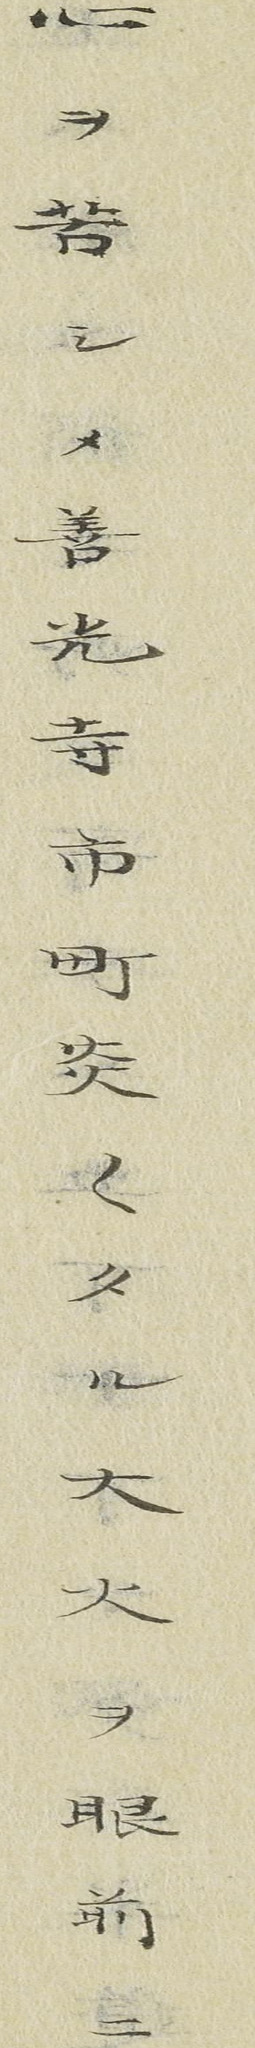心ヲ苦シメ善光寺市町炎〱タル大火ヲ眼前ニ
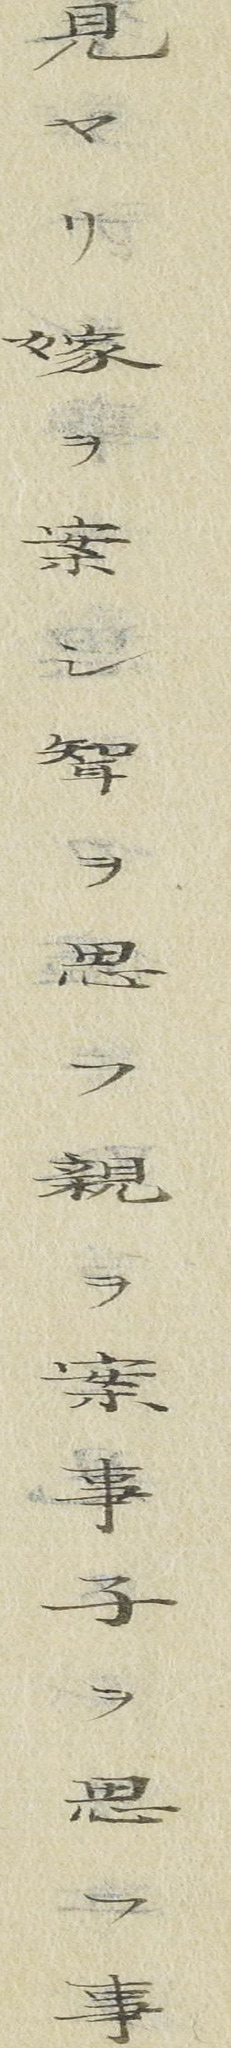見ヤリ嫁ヲ案シ聟ヲ思フ親ヲ案事子ヲ思フ事
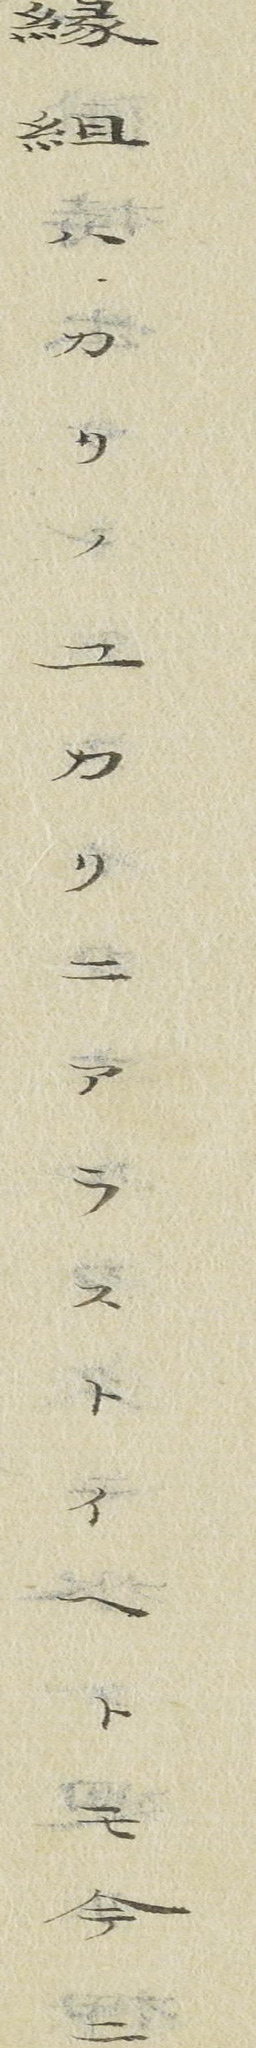縁組ハカリノユカリニアラストイヘトモ今ニ
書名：地災撮要　地震之部　巻ノ二
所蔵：東京大学地震研究所図書室 Earthquake Research Institute Library, The University of Tokyo, JAPAN
